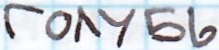голубь
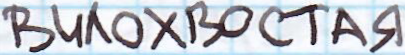вилохвостая
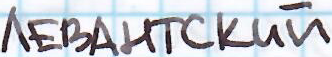левантский
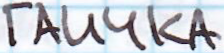гаичка
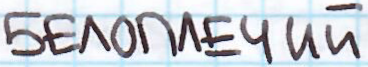белоплечий
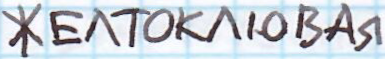желтоклювая
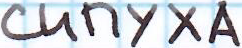сипуха
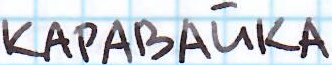каравайка
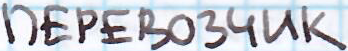перевозчик
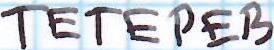тетерев
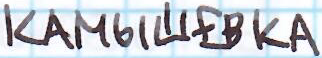камышевка
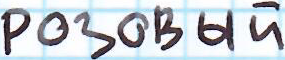розовый
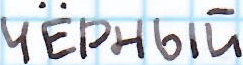чёрный
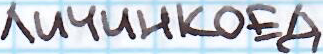личинкоед
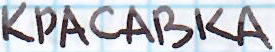красавка
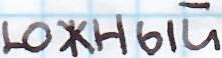южный
